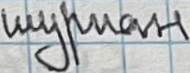турпан
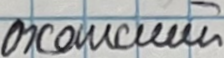охотский
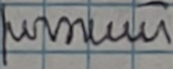рыжий
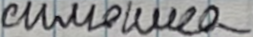сплюшка
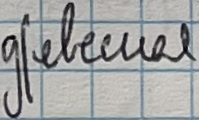древесная
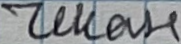чекан
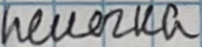пеночка
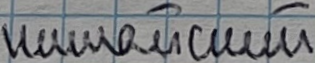китайский
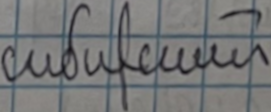сибирский
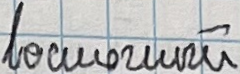восточный
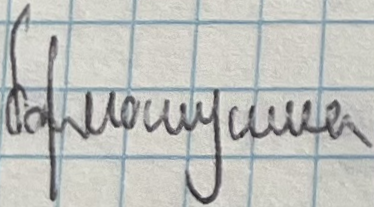бормотушка
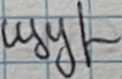щур
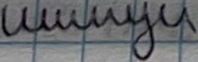шипун
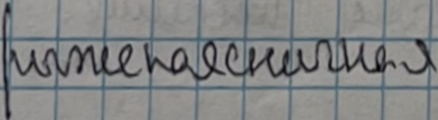рыжепоясничная
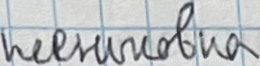теньковка
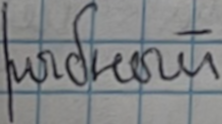рыбный
